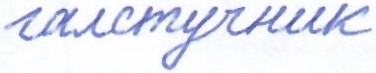галстучник
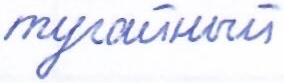тугайный
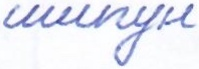шипун
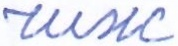чиж
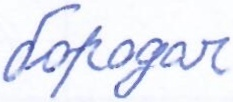бородач
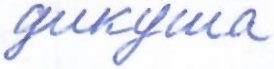дикуша
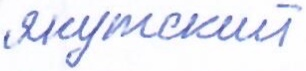якутский
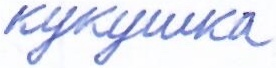кукушка
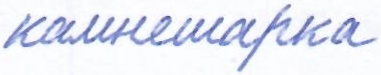камнешарка
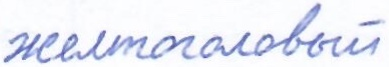желтоголовый
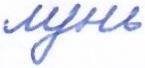лунь
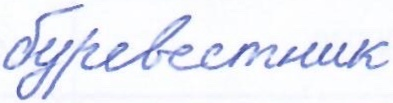буревестник
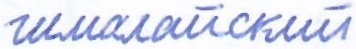гималайский
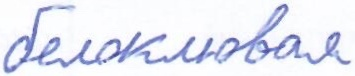белоклювая
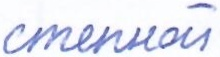степной
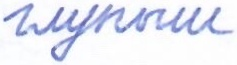глупыш
